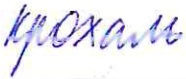крохаль
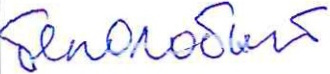белолобый
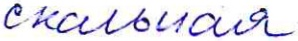скальная
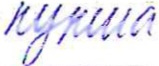кукша
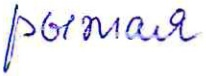рыжая
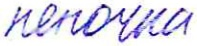пеночка
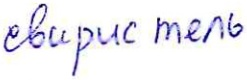свирис тель
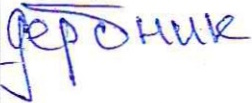дербник
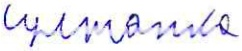султанка
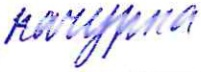качурка
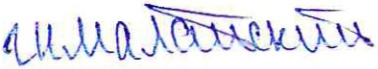гималайский
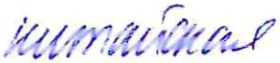китайская
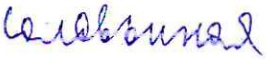соловьиная
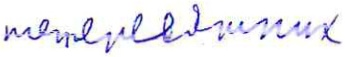тетеревятник
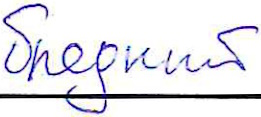бледный
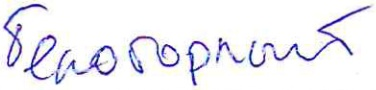белогорлый
